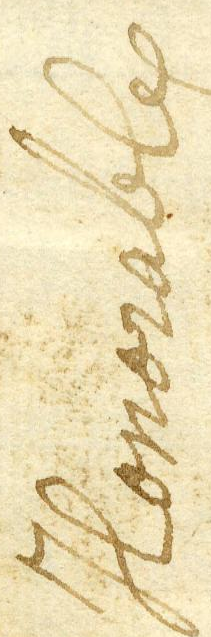Honorable
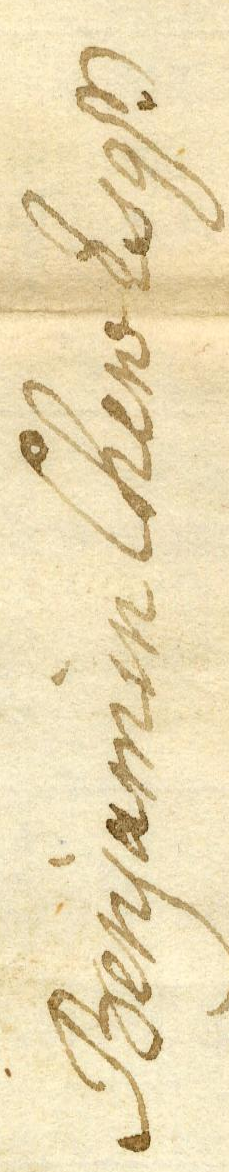Benjamin Chew Esq^r.
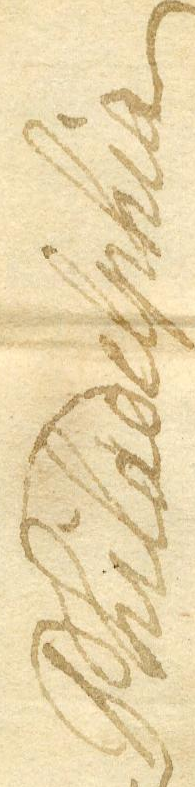Philadelphia
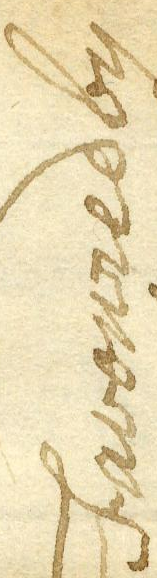Favoured by
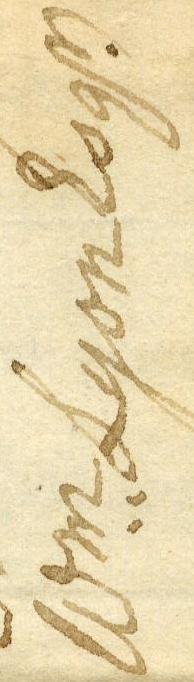W^m.. Lyon Esq^r.
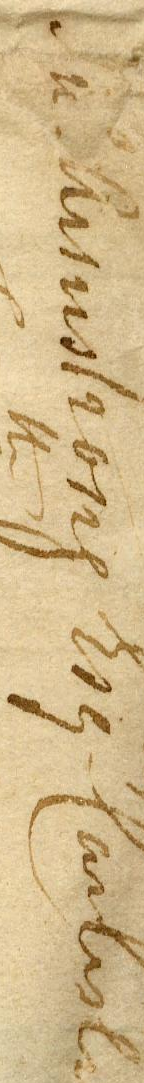Jn^o. Armstrong Esq^r. Carlisle
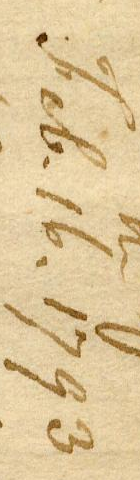Feb. 16^th. 1793-
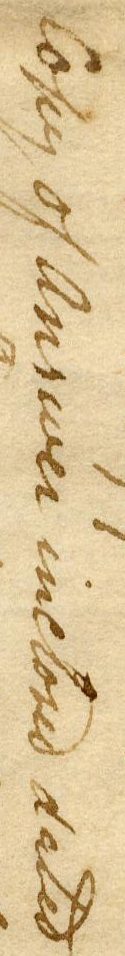Copy of Answer inclosed dated
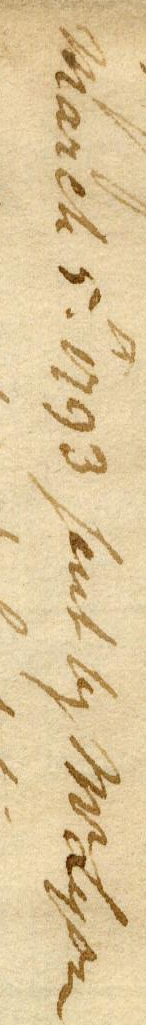March 5^th. 1793 Sent by M^r Lyon
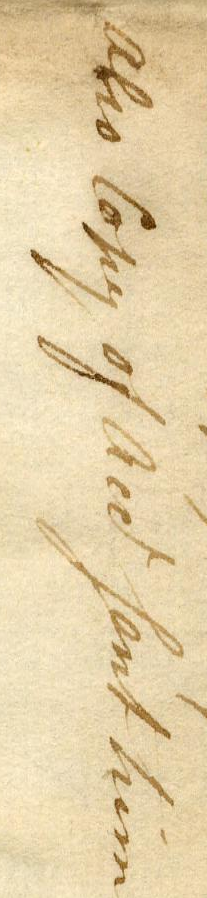Also Copy of Acc^t Sent him
